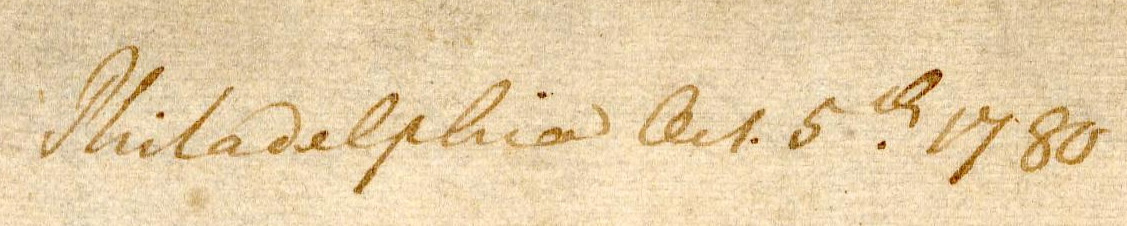Philadelphia Oct. 5^th. 1780
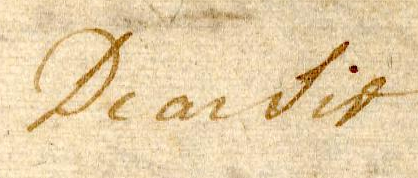Dear Sir
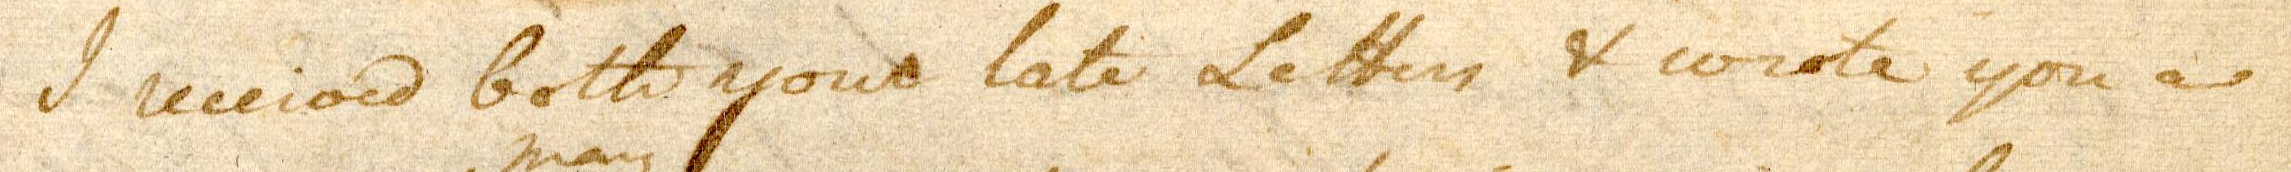I received both your late Letters & wrote you a
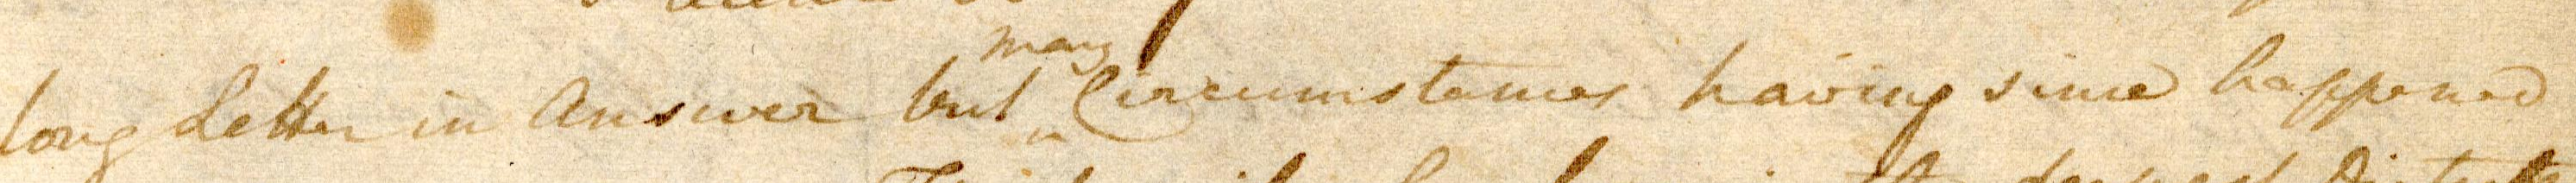long Letter in Answer but Circumstances having since happened
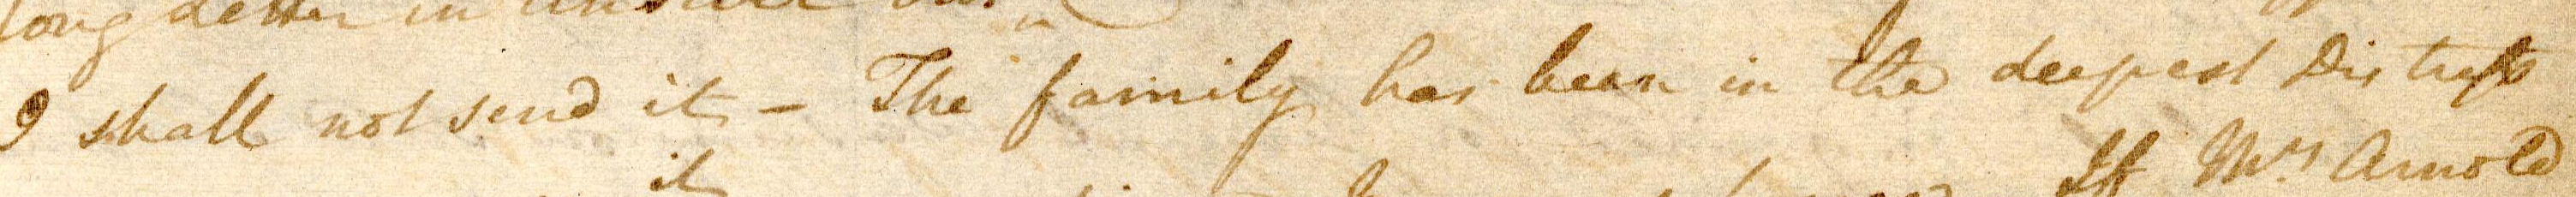I shall not send it. The family has been in the deepest Distress
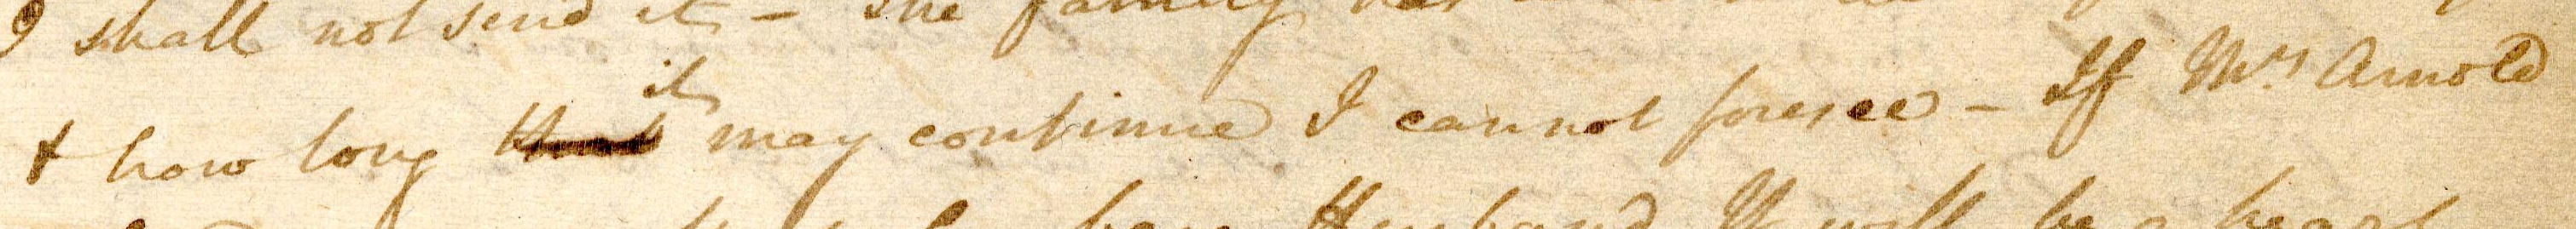& how long that ^ may confine I cannot foresee. If M^rs. Arnold
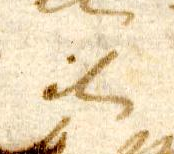it
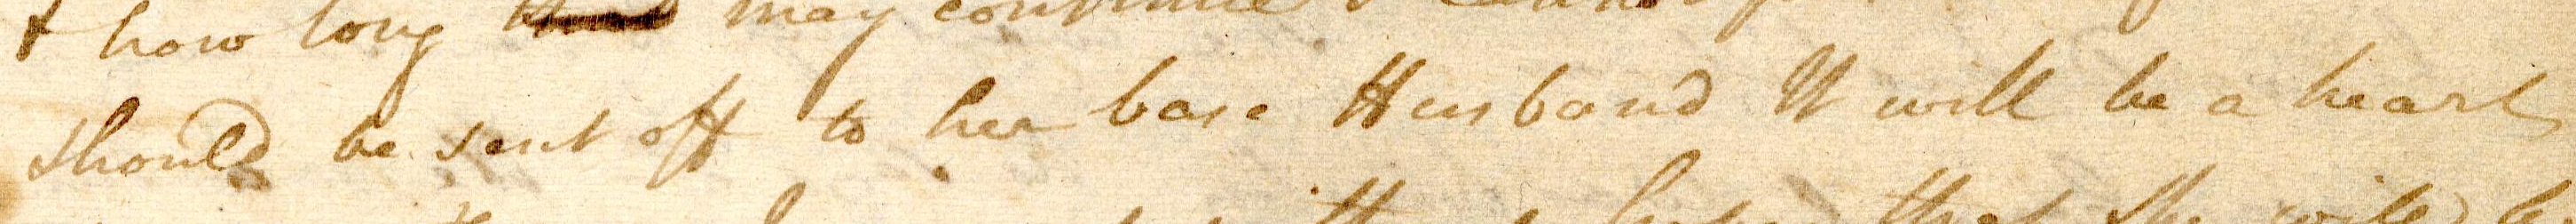should be sent off to her base Husband It will be a heart
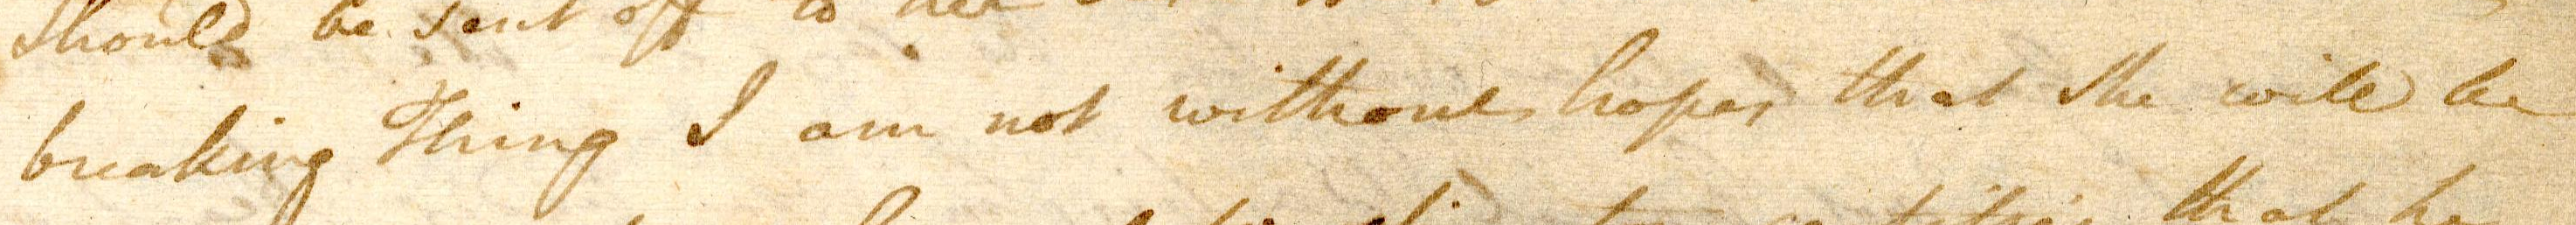breaking Thing I am not without hope that she will be
